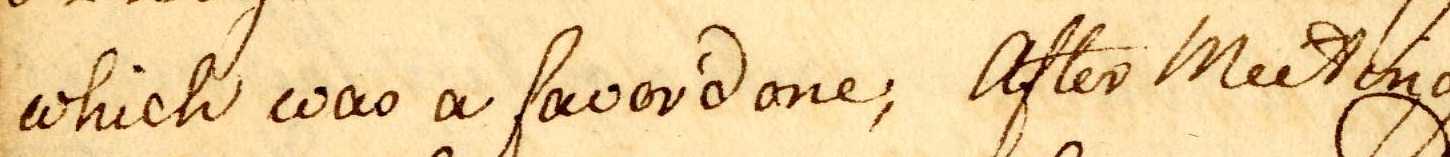which was a favor'd one, After Meeting
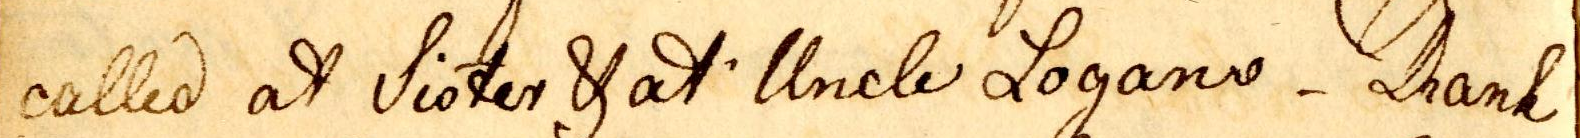called at Sister & at Uncle Logans- Drank
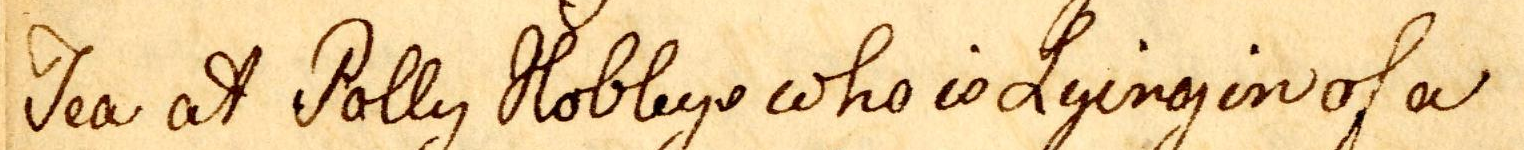Tea at Polly Hobleys who is Lying in of a
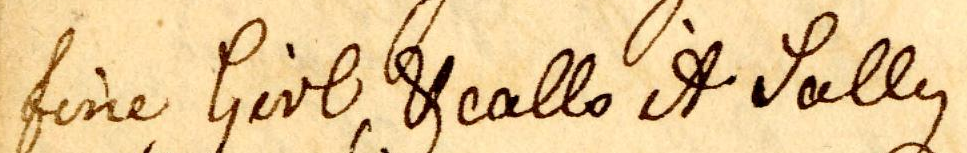fine Girl, & calls it Sally
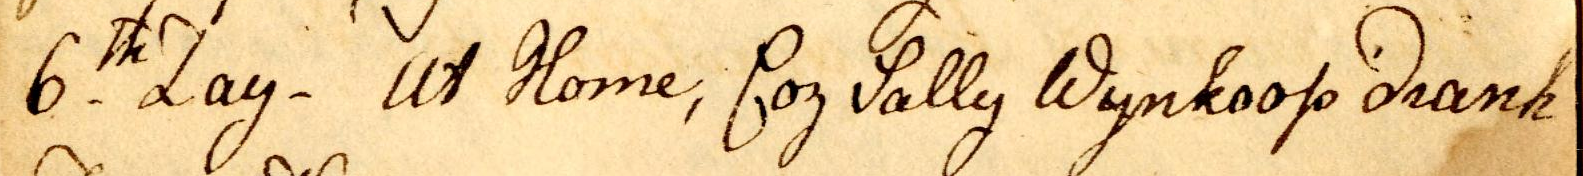6^th. Day- At Home, Coz Sally Wynkoop drank
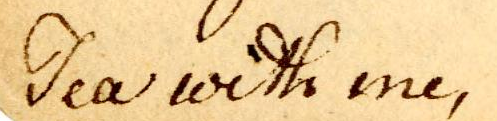Tea with me,
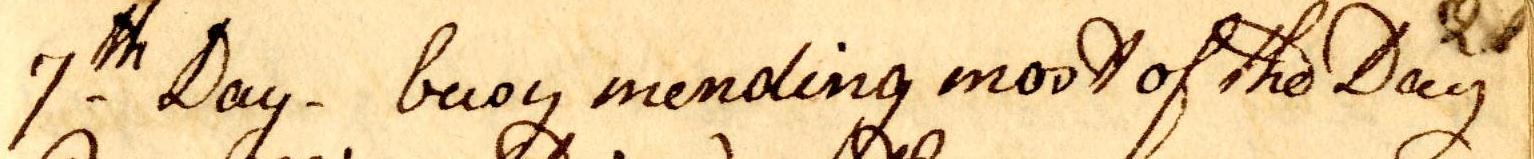7^th. Day- busy mending most of the Day
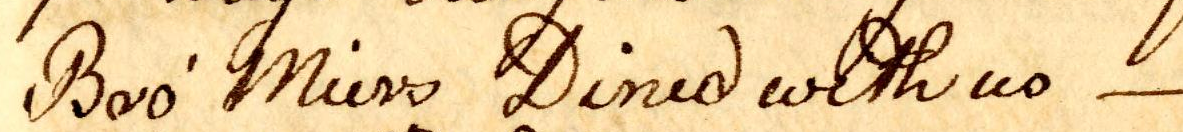Bro' Miers Dined with us
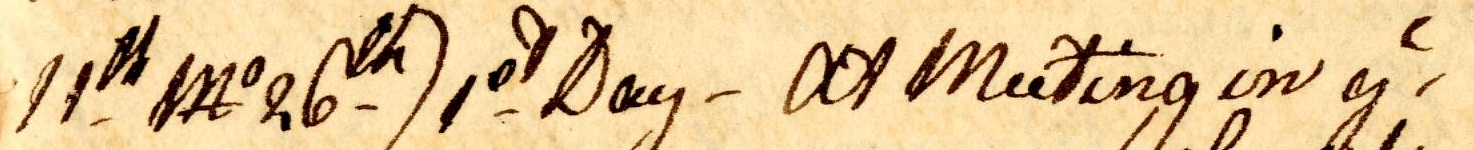11^th M^o 26^th) 1^st Day- At Meeting in y^e.
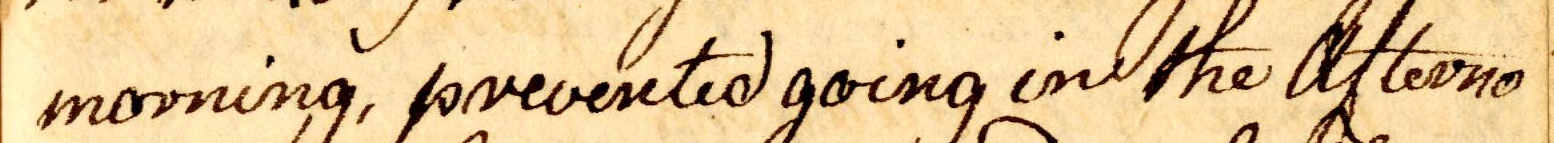morning, prevented going in the Afterno
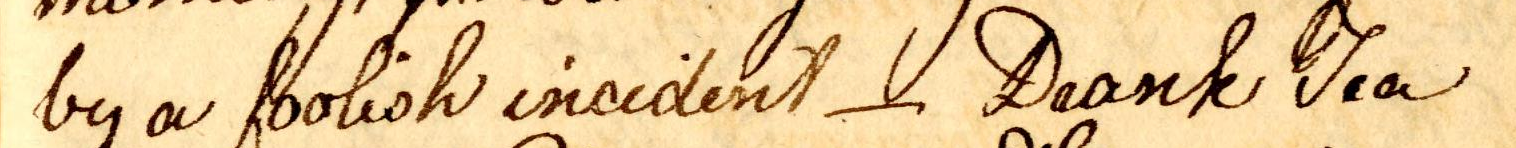by a foolish incident- Drank Tea
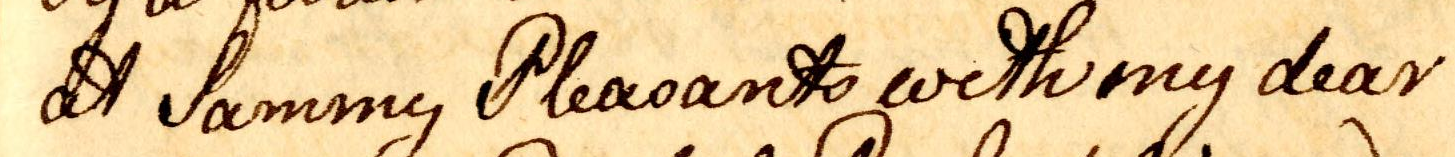at Sammy Pleasants with my dear
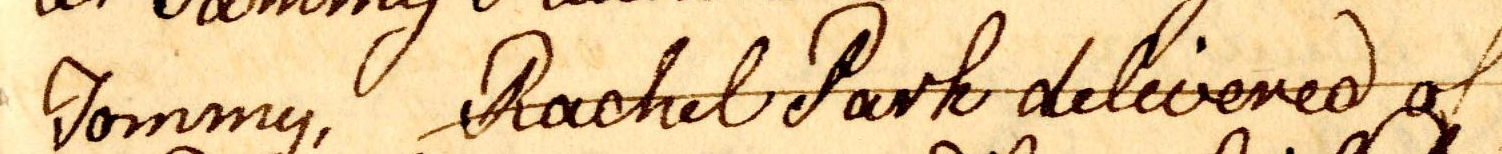Tommy, [Rachel Park delivered of]
